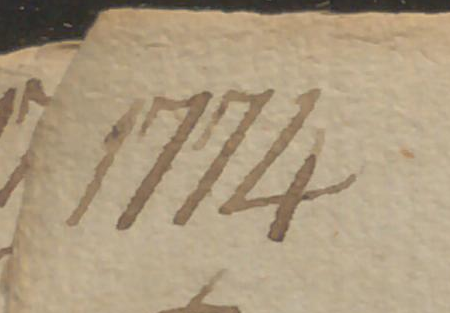1774
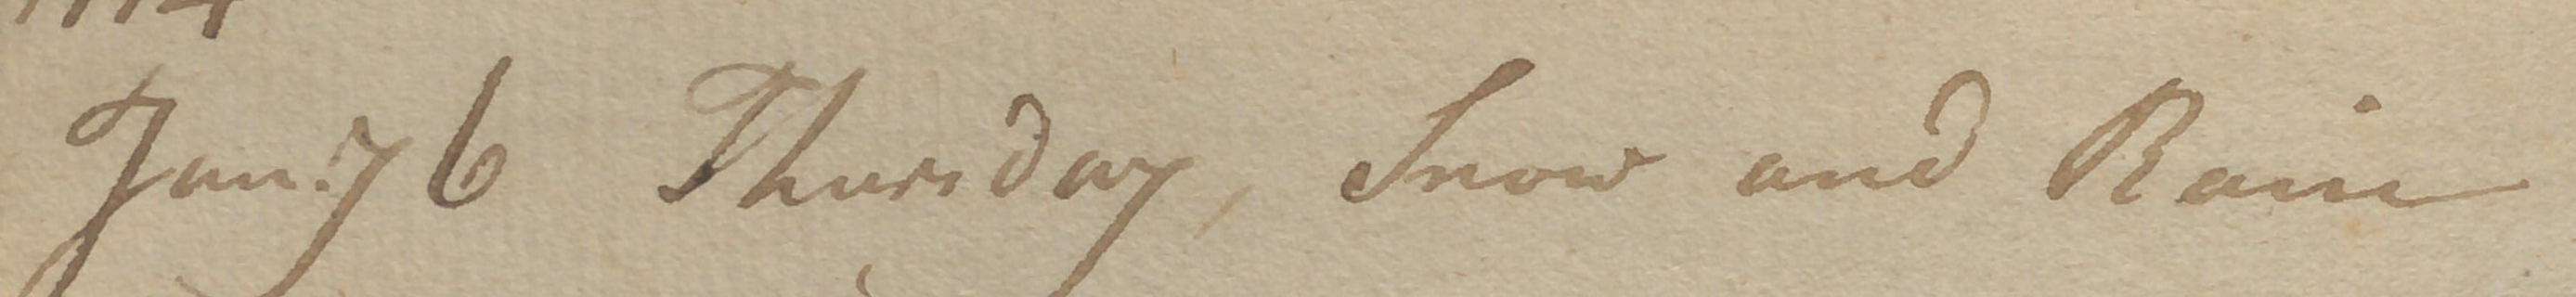Jan^y. 6 Thursday Snow and Rain
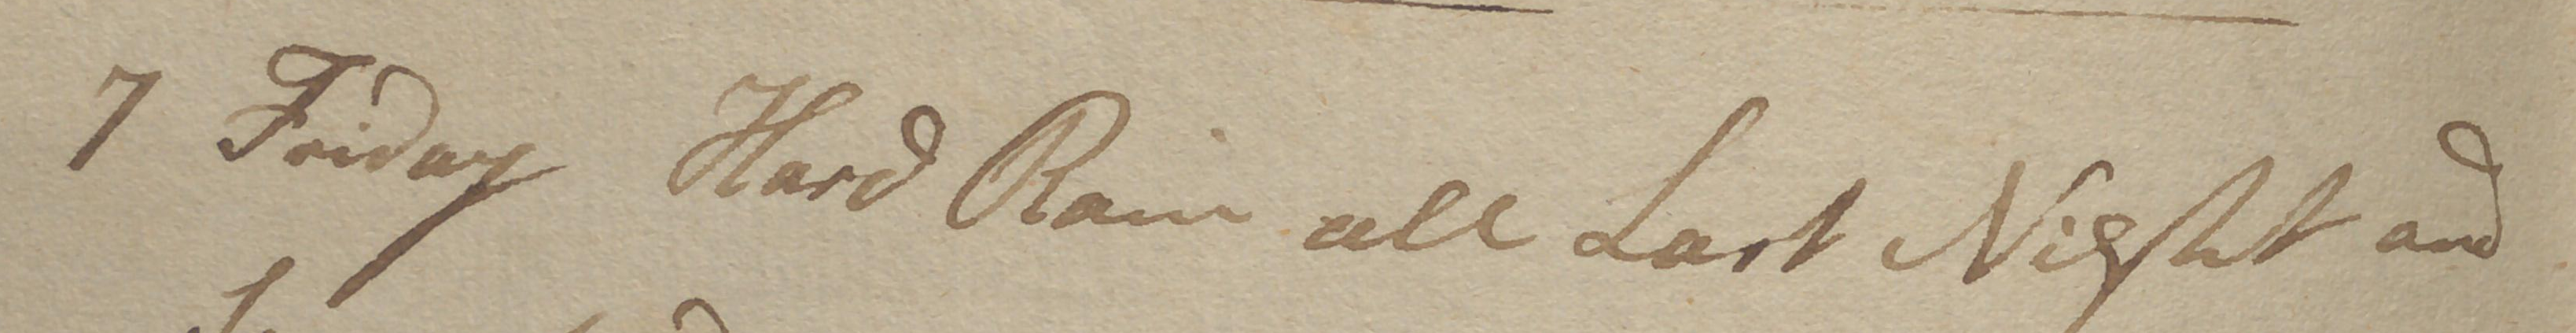7 Faiday Hard Rain all Last Night and
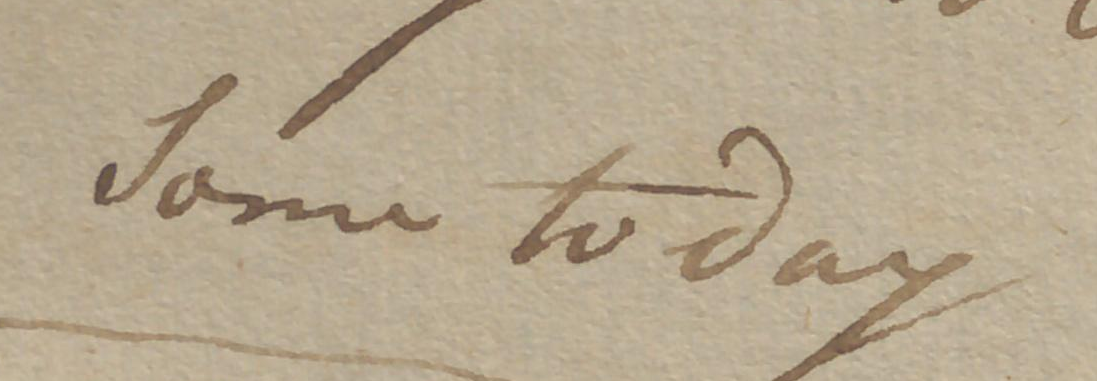some today
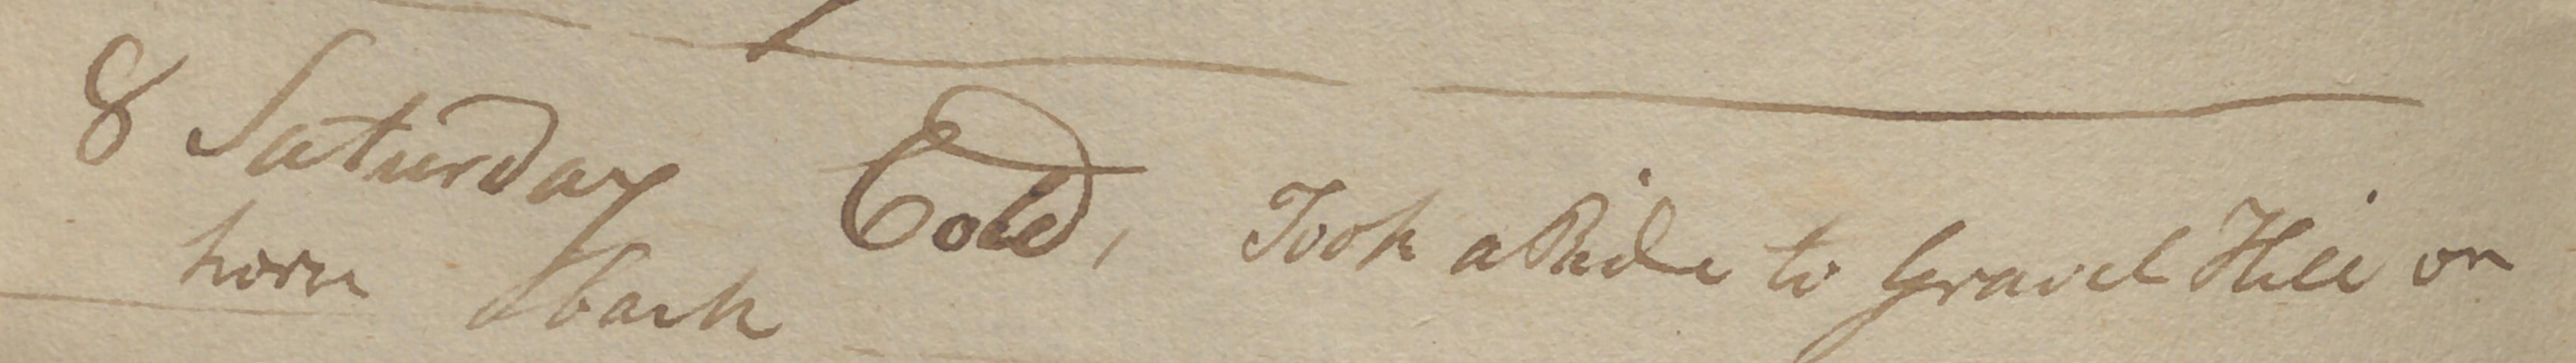8 Saturday Cold, Took a Ride to Gravel Hill on
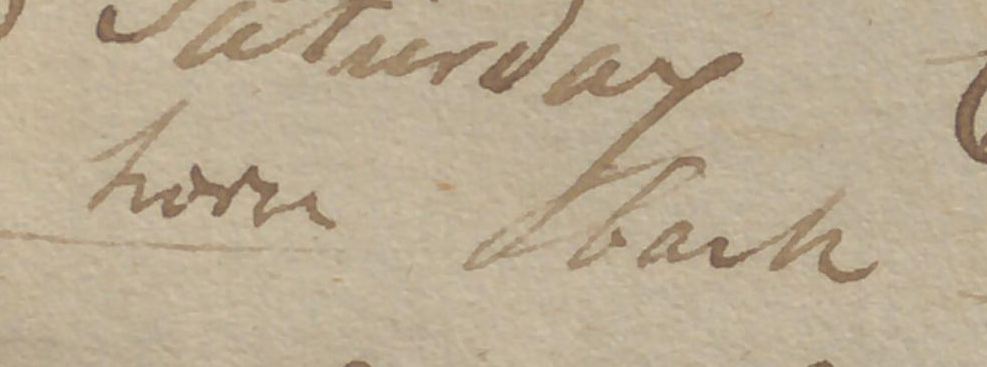horse back
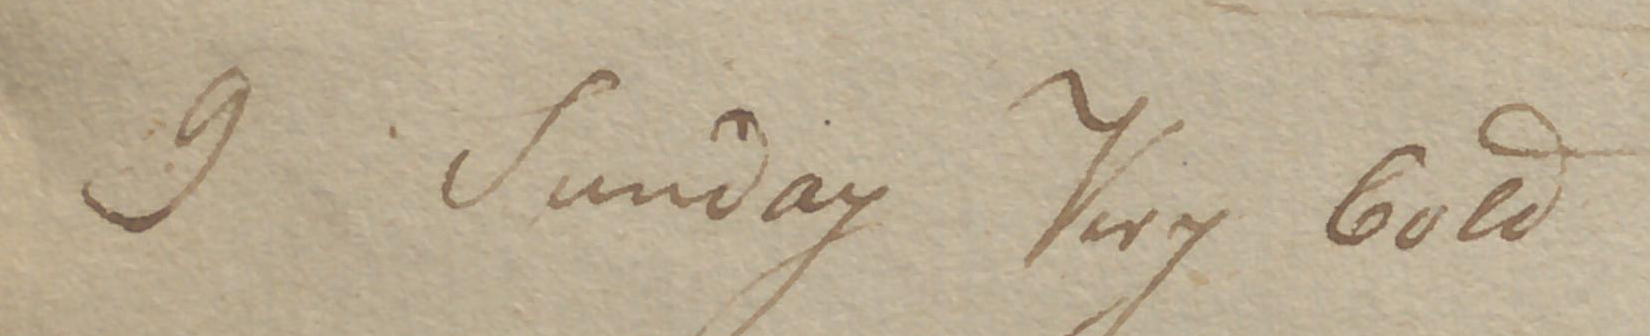9 Sunday Very Cold
